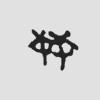共
